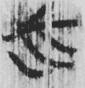必
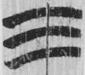三
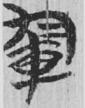軍（軍）
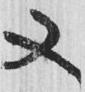又（有）
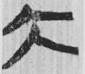大
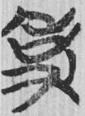事
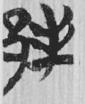邦
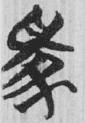家
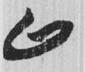㠯（以）
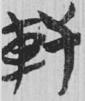軒（杌）
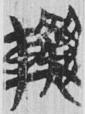○（隉）
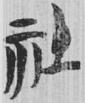社
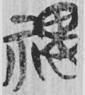○（稷）
